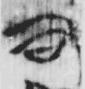司
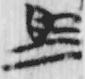馬
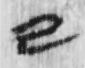己
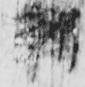新
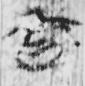官
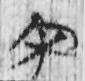宋
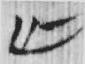亡
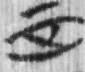正
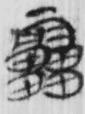雷
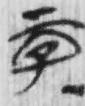○（娩）
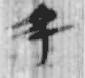丑
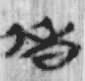俈
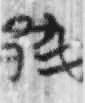○（求）
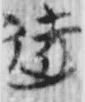遶
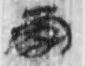丙
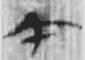午
